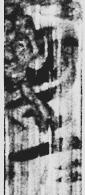童
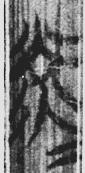光
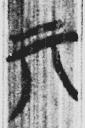亓
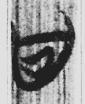昌
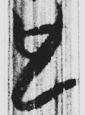也
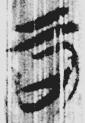可
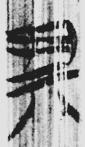○（期）
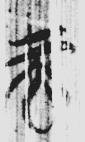而
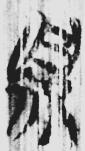須
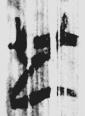也
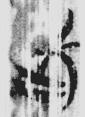此
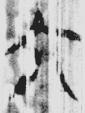六
